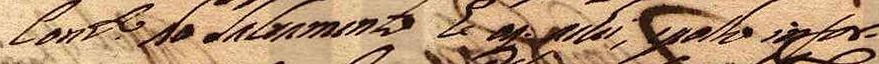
Conv.to do SaCramento he as achei, e posso infor
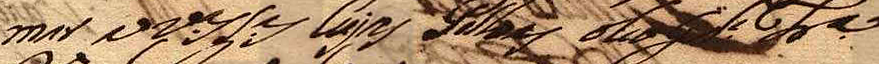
mar a v.as s.as Cujas Pessoas o Ceo Gd.e Lxa.
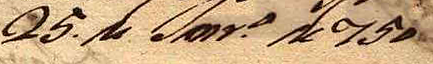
25. de Ianr.o de 750
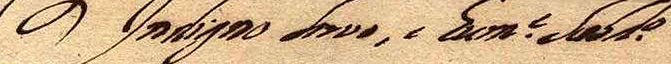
Jndigno Servo, e hum.e Subd.o
